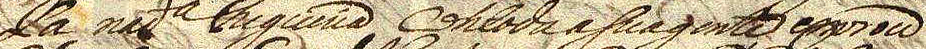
La na d̄a Freguesia con toda a sua gente, e morou
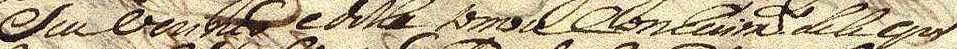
Seu Vesinho e della tomou conhecim.to dele e por
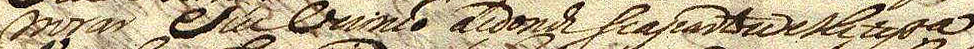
morar Seu Visinho de donde se apartou elle testa
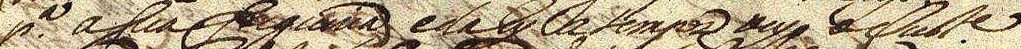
p.a a sua freguezia, e dahy a tempoz veyo o Iust.e
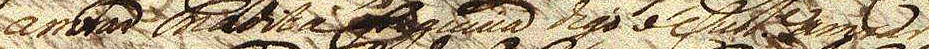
a morar na dita freguesia digo o Iust.e a morar
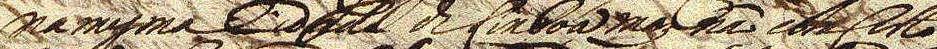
na mesma Cidade de Lixboa mas não esta Certo
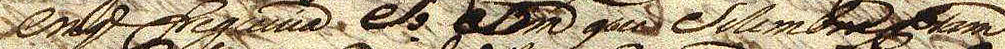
em q̄ freguesia So sim que Se lembra foram
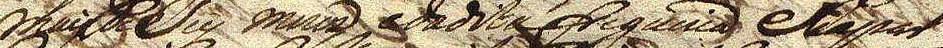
mais de Seis meses, e da dita freguesia Se apar
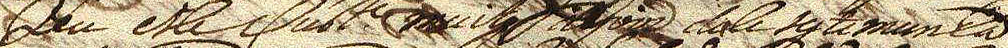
tou elle Iust.e muito depoiz dele testemunha
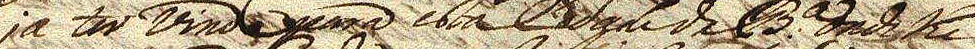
ja ter vindo para esta Cidade da B.a; onde lhe
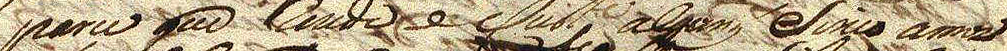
pareçe que Rezide o Iust.e alguns Sinco annoz
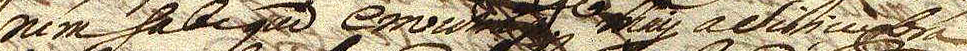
nem sabe que em outr__e mais aSistiçe fora
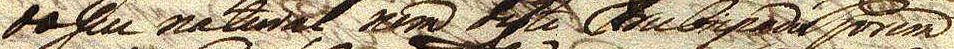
do seu natural, nem deste Arcebispado porem
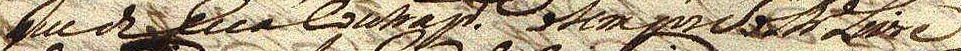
que de hua e outra p.te o tem por Soltr.o Livre
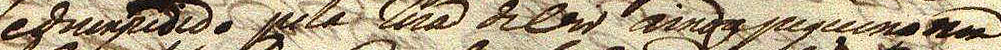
e desinpedido pela Rezā de Vir ainda pequeno nem
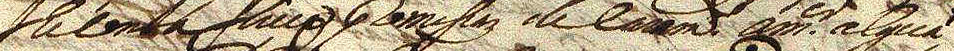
he consta fizeçe promessas de Cazam.to a m.er alguā,
